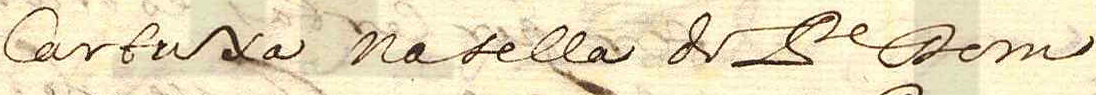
Cartuxa na sella do Pe Dom
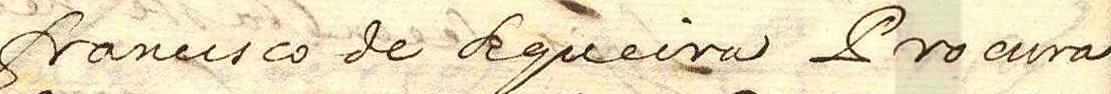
Francisco de Sequeira Procura
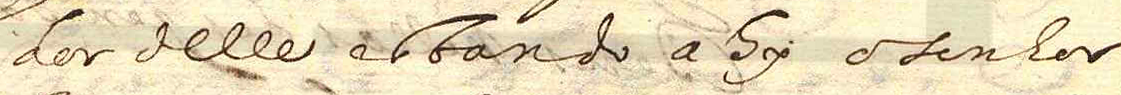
dor delle estando ahy o senhor
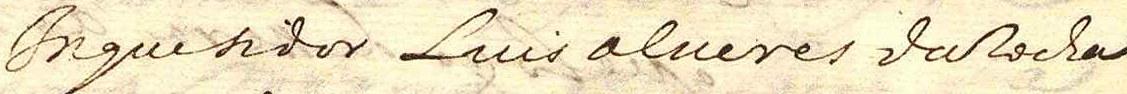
Inquisidor Luis alueres da Rocha
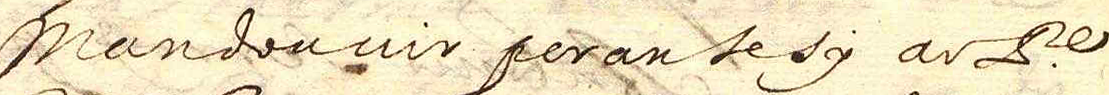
mandou uir perante sy ao P.e
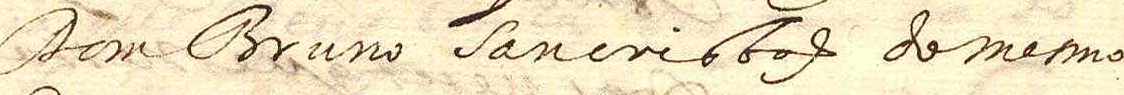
Dom Bruno Sancristaõ do mesmo
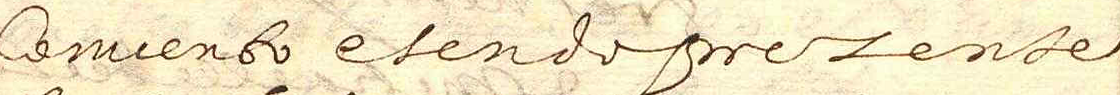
Conuento e sendo prezente
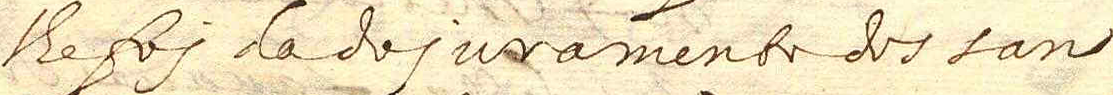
lhe foj dado juramento dos san
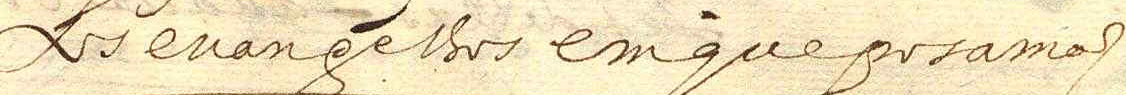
tos euangelhos em que pos a maõ
